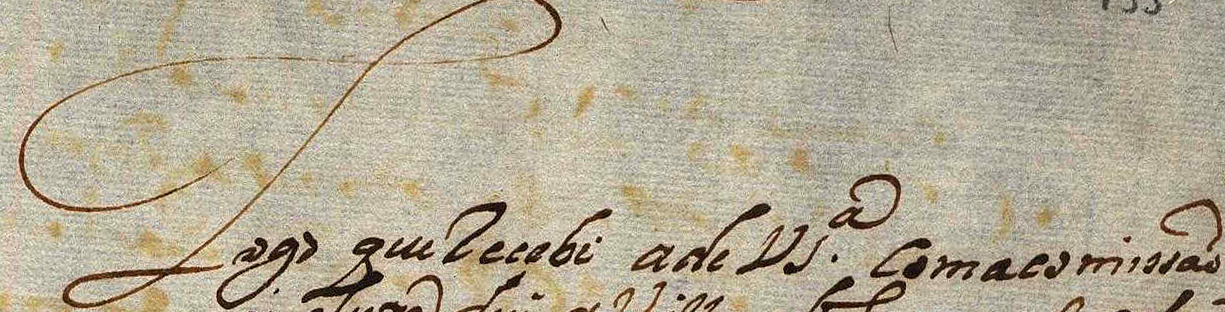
Logo que Recebi a de V S.a com a comissaõ
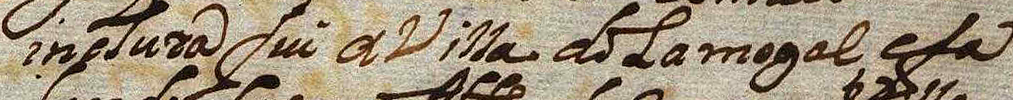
incluza fui a Villa do Lamogal, e fa
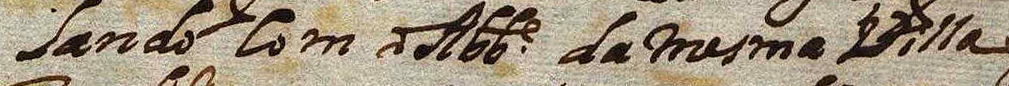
Lando Com o Abb.e da mesma Villa
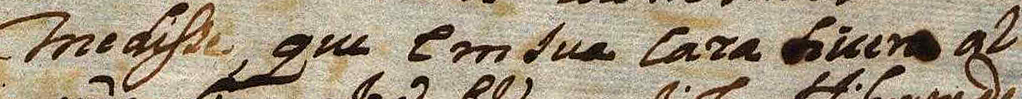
me disse que em sua caza dicera al
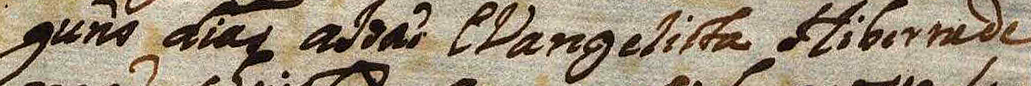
gun̄s dias a Ioaõ EVangelista Hiberne de
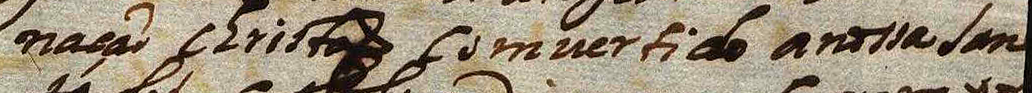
naçaõ Christaõ Comuertido a nossa san
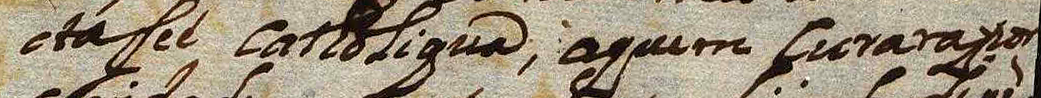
cta feé catholiqua, a quem Curara por
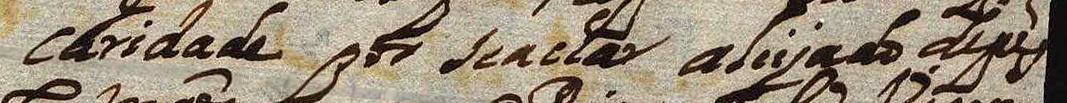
caridade por se achar aleijado de pés
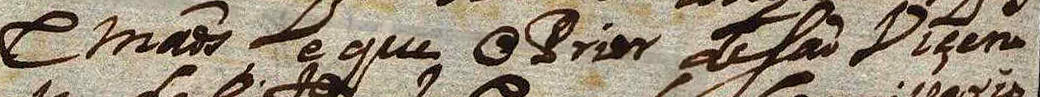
E maõs e que o Prior de saõ Vicen
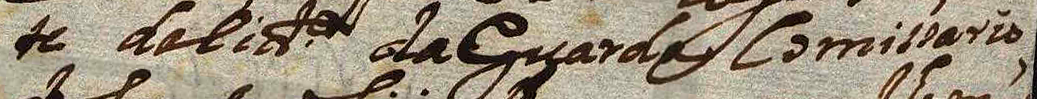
te da Cid̄.e da Guarda Comissario
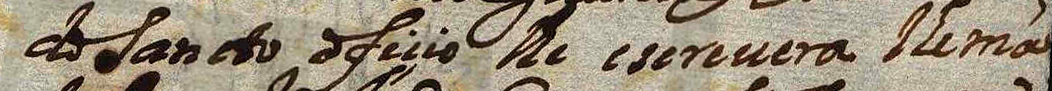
do Sancto oficio lhe escreuera lhe ma
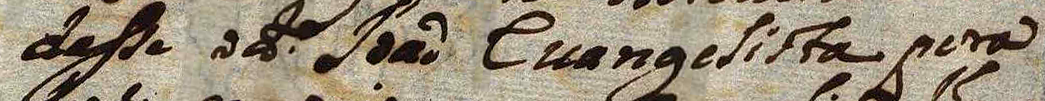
desse o d̄.o Ioaõ Euangelista pera
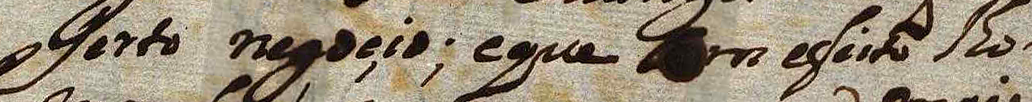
serto negocio; e que C_m efeito lho
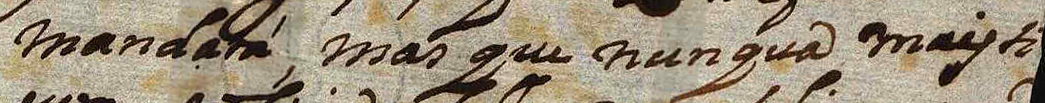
mandará, mas que nunqua mais ti
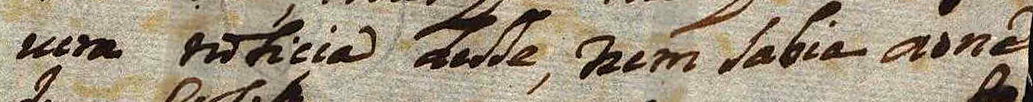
uera noticia delle, nem sabia aond
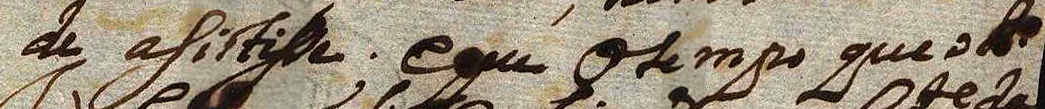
de asistisse. e que o tempo que o d̄.o
